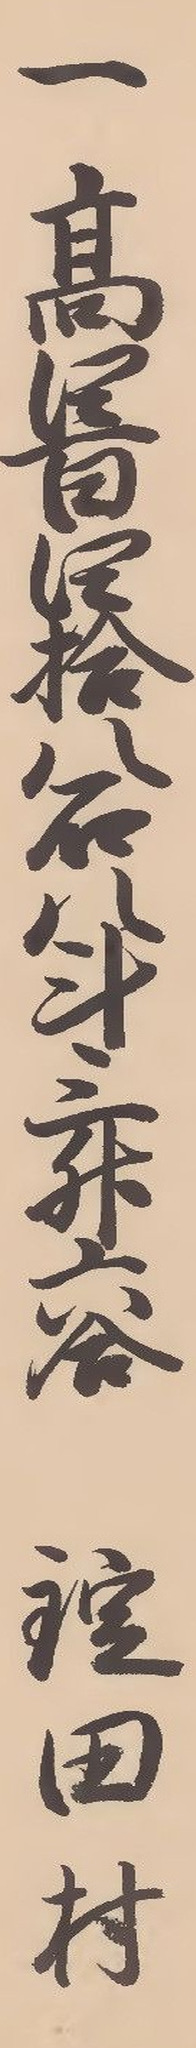一高四百四拾八石八斗三升六合錠田村
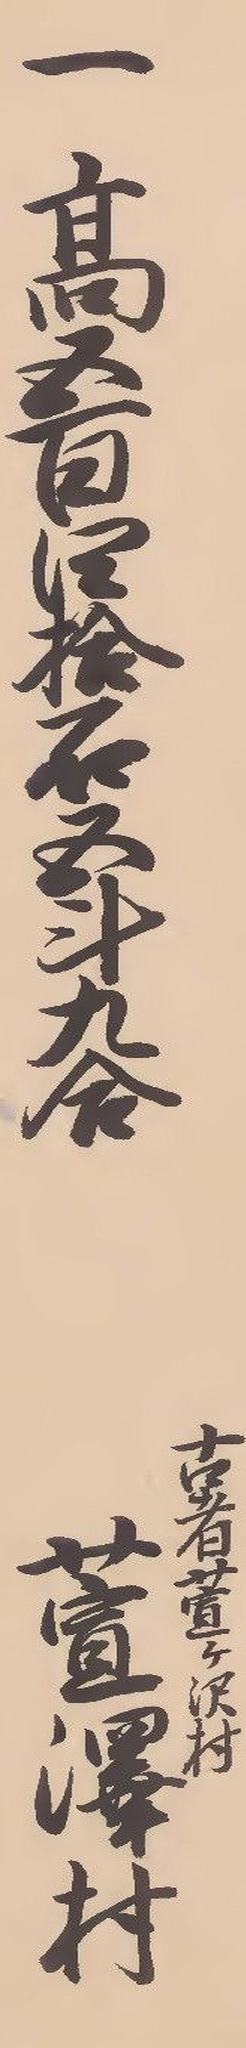一高五百四拾石五斗九合萱沢村
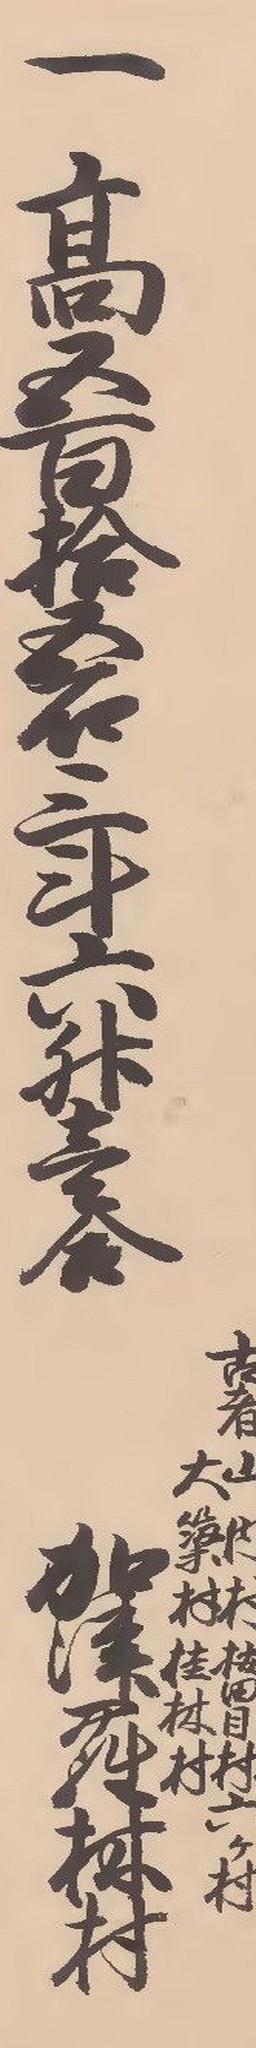一高五百拾五石三斗六升壱合加津羅林村
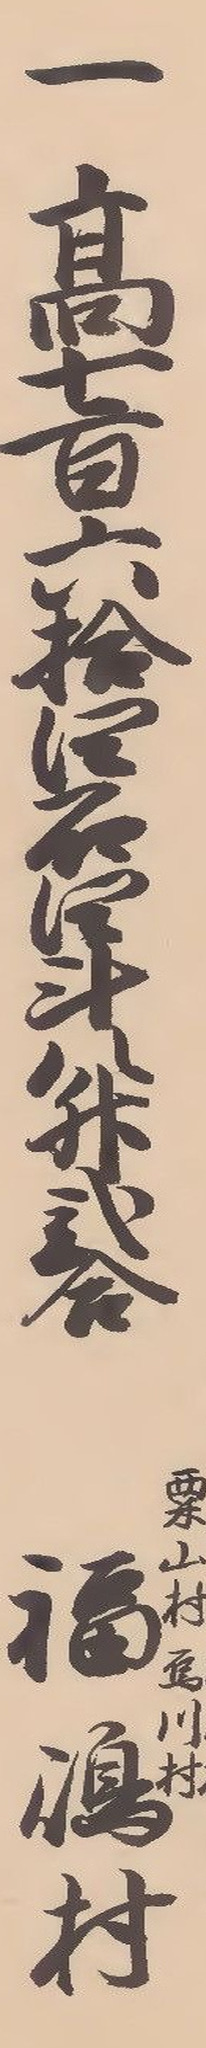一高七百六拾四石四斗八升弐合福島村
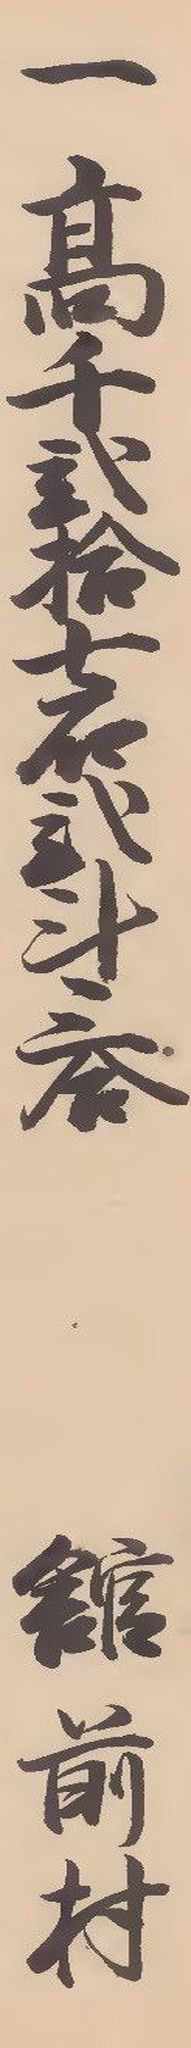一高千弐拾七石弐斗三合館前村
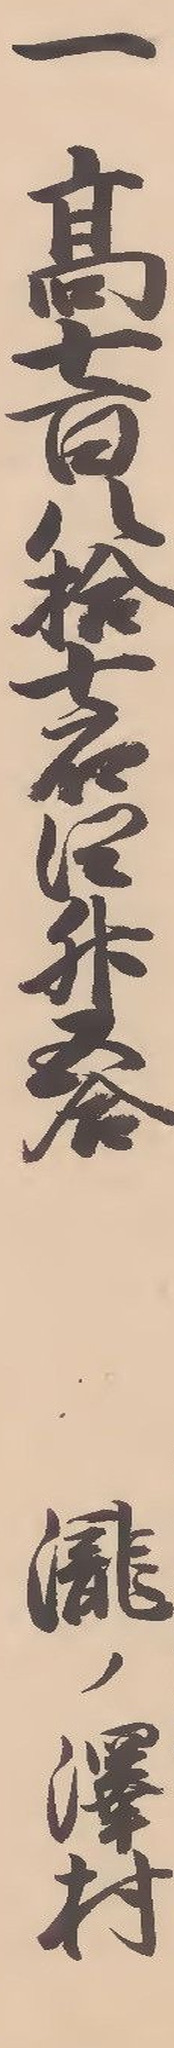一高七百八拾七石四升五合滝ノ沢村

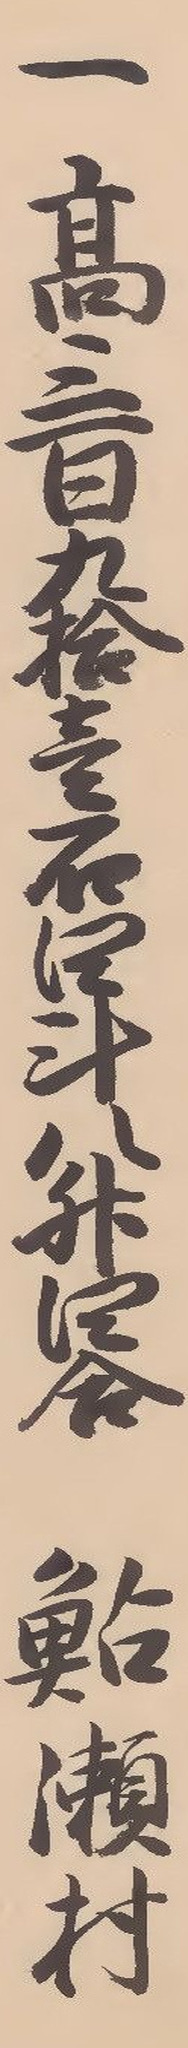一高三百九拾壱石四斗八升四合鮎瀬村
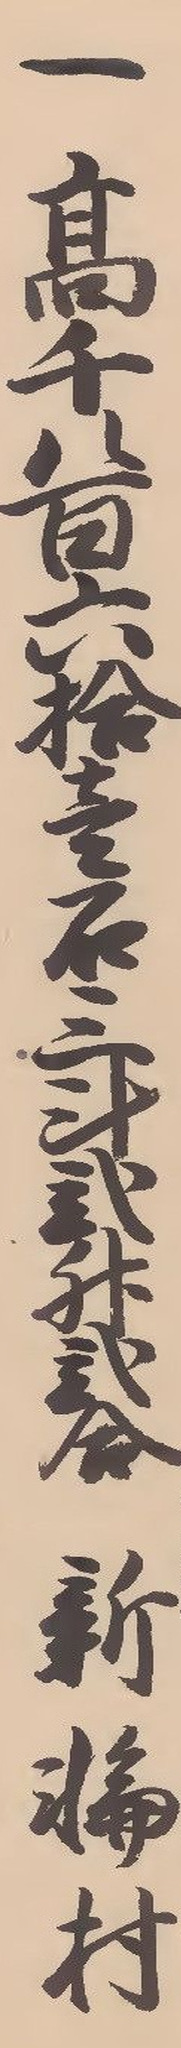一高千八百六拾壱石三斗弐升弐合新輪村
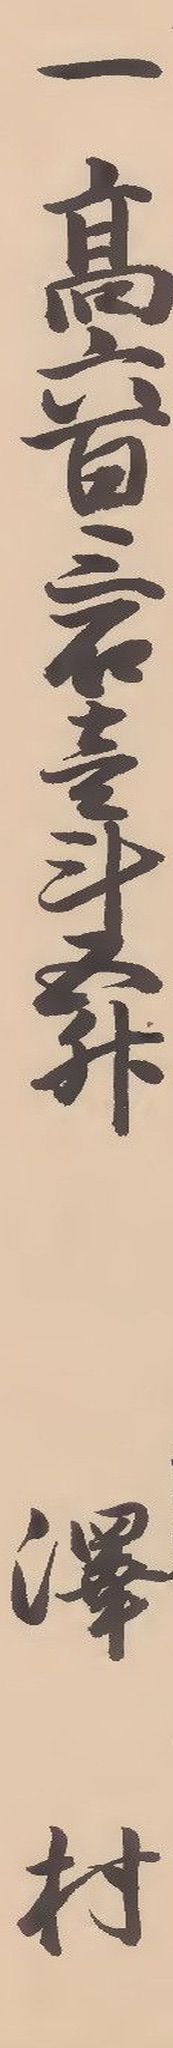一高六百三石壱斗五升沢村
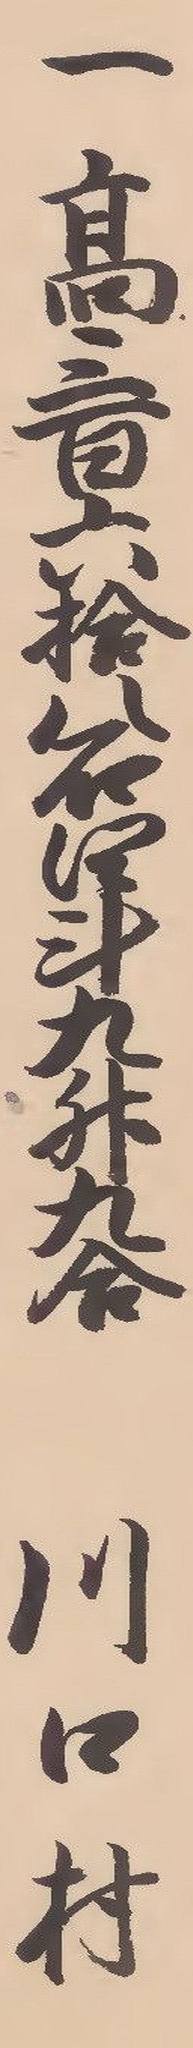一高三百六拾八石四斗九升九合川口村
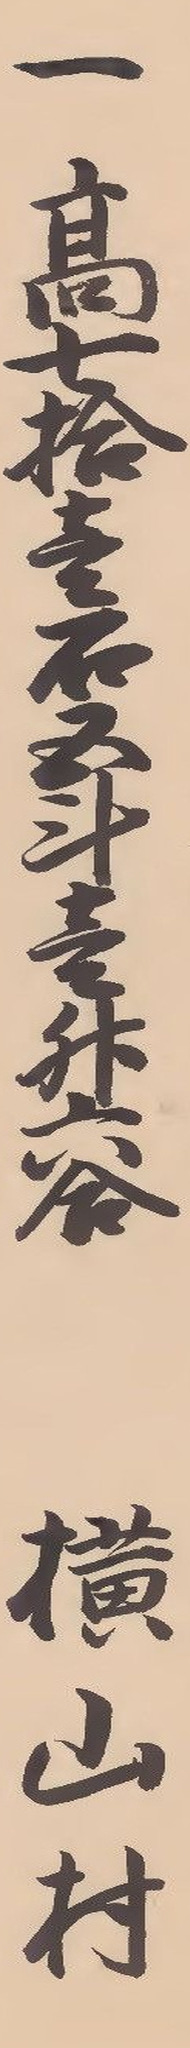一高七拾壱石五斗壱升六合横山村
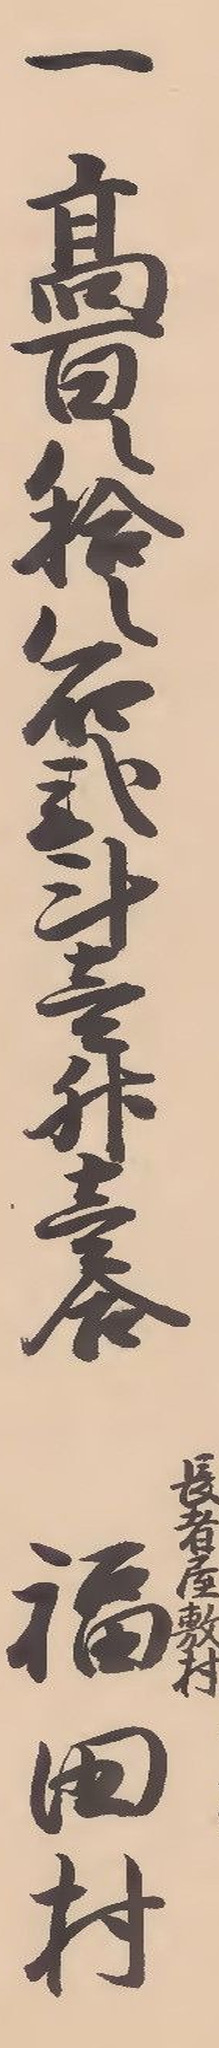一高百八拾八石弐斗壱升壱合福田村
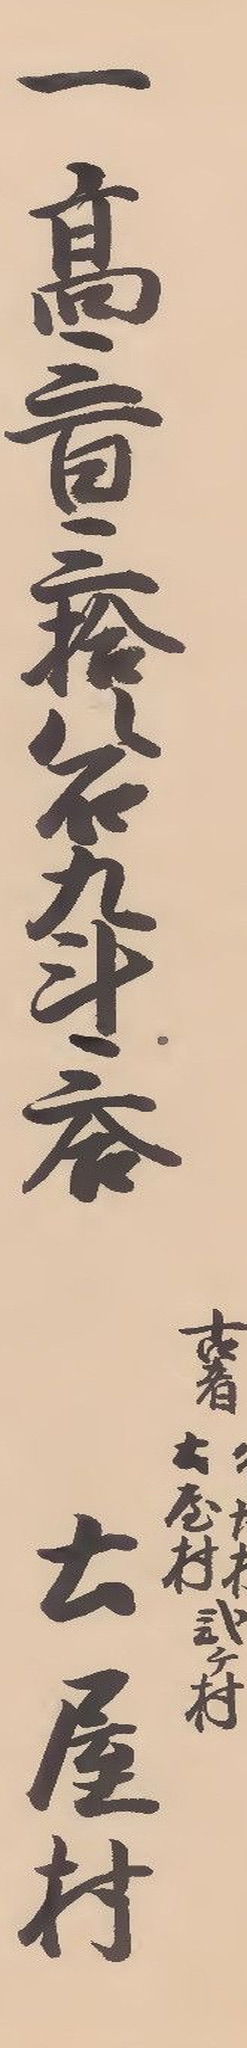一高三百三拾八石九斗三合土屋村
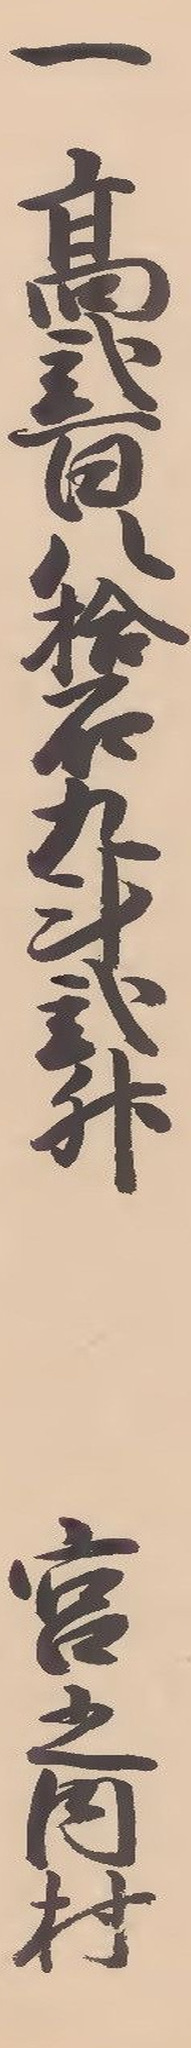一高弐百八拾石九斗弐升宮之内村

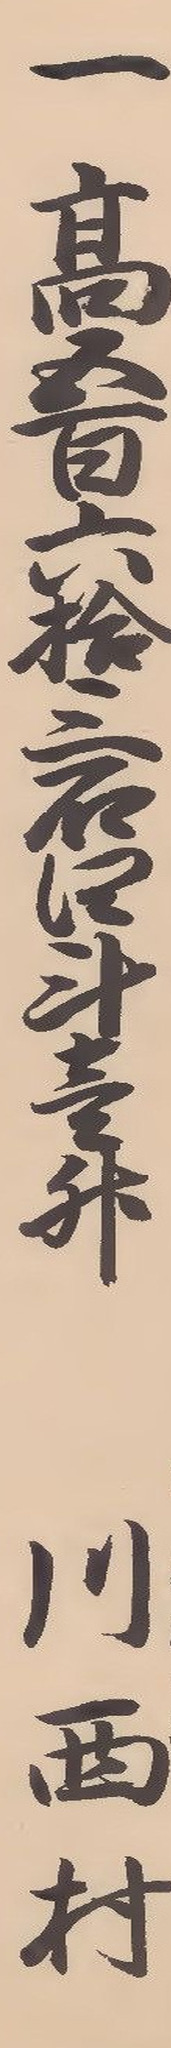一高五百六拾三石四斗壱升川西村
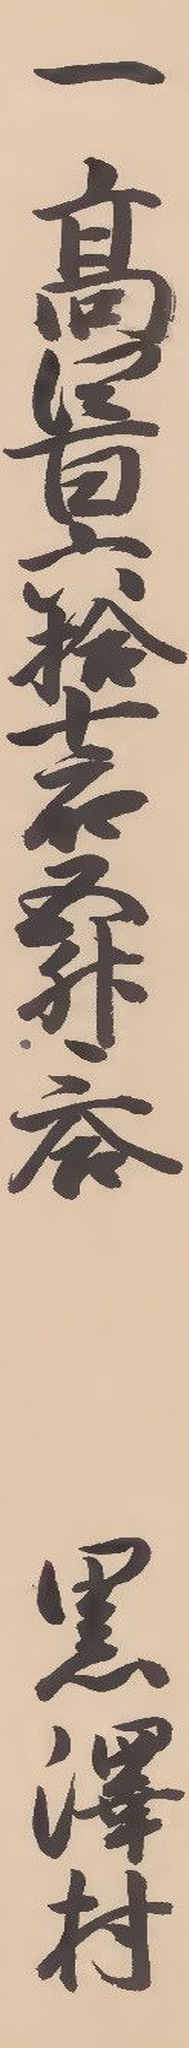一高四百六拾七石五升三合黒沢村
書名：出羽国郷帳　５
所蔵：国立公文書館 National Archives of Japan
